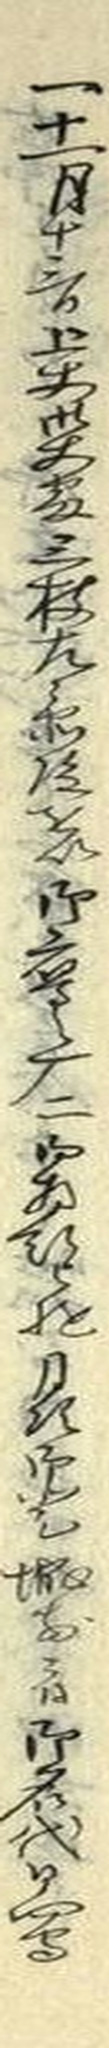一十一月十三日上使御御使番三枝左兵衛殿を以御鷹之雁二御拝領被遊月次御登城前ニ付御名代日向守
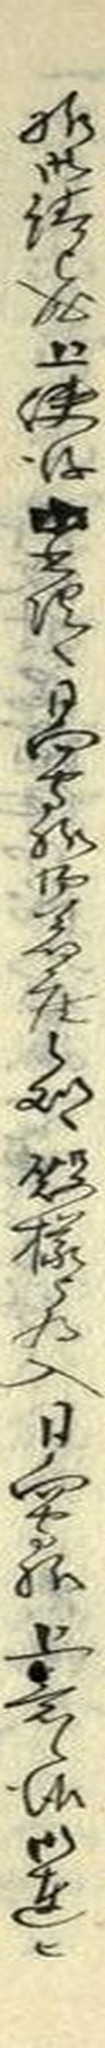様御請被成上使後小書院へ日向守様御着座之処へ殿様被為入日向守様上意之趣御達被
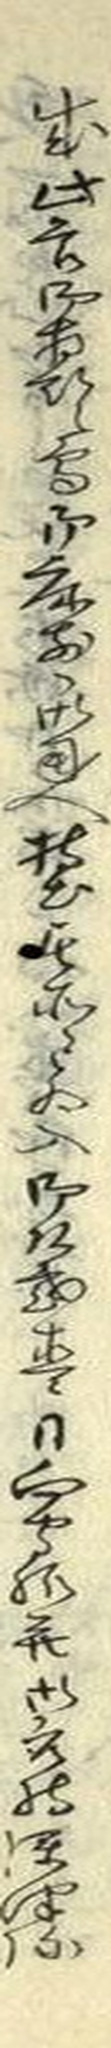成此節御拝領之鳥御床前へ御用人持出其所へ被為入御頂戴直ニ日向守様幷御取持深津弥
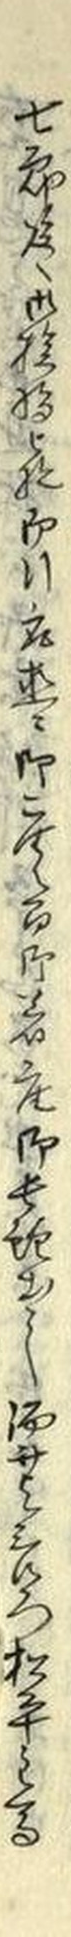七郎殿へ御挨拶被遊御引取直ニ御座之間御着座御長鮑出之酒井与三左衛門松平主馬
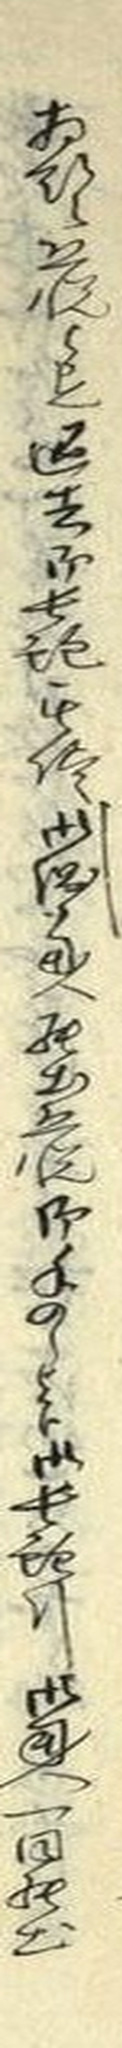拝領之恐悦被申上退去御長鮑其儘御側御用人罷出恐悦御手のし被下御長鮑引御用人一同罷出
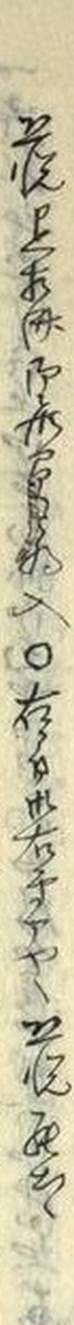恐悦申上相済御居間へ被為入〇右ニ付御右筆部屋へ恐悦罷出候
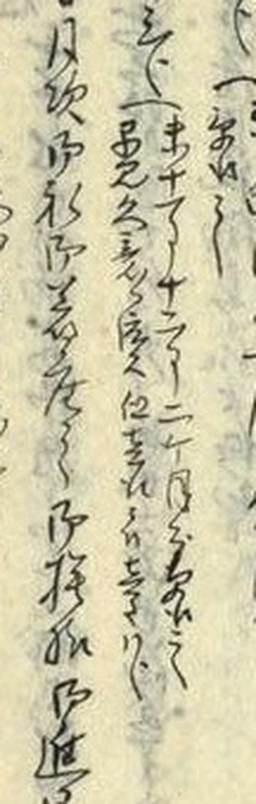早見久意へ渡之但壱俵二付壱匁八分同部屋
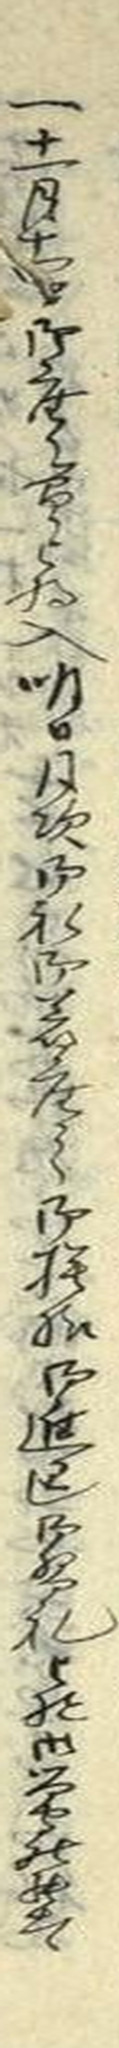一十一月十四日御座之間へ被為入明日月次御礼御着座之御模様御進退御習礼被遊御留守居罷出候

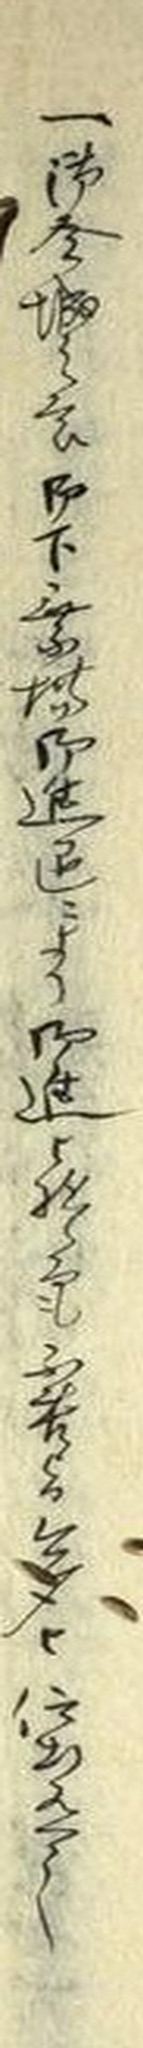一御登城之節御下乗場御進退ニより御進被遊而も不苦旨今夕被仰出有之
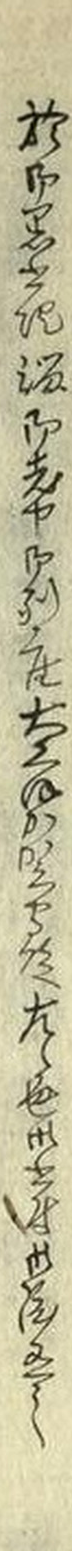於御黒書院溜御老中御列座大久保加賀守殿左之通御書付御渡有之
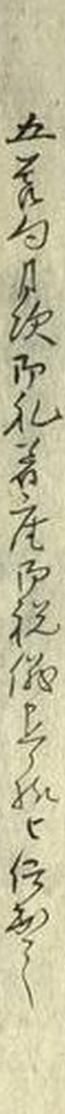五節句月次御礼着座御祝儀申上候様被仰出之松平御名
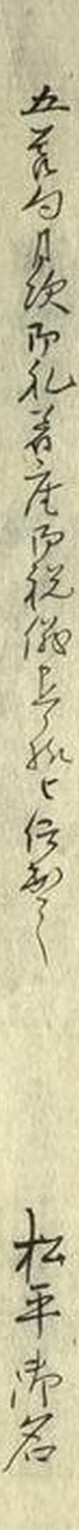五節句月次御礼着座御祝儀申上候様被仰出之松平御名
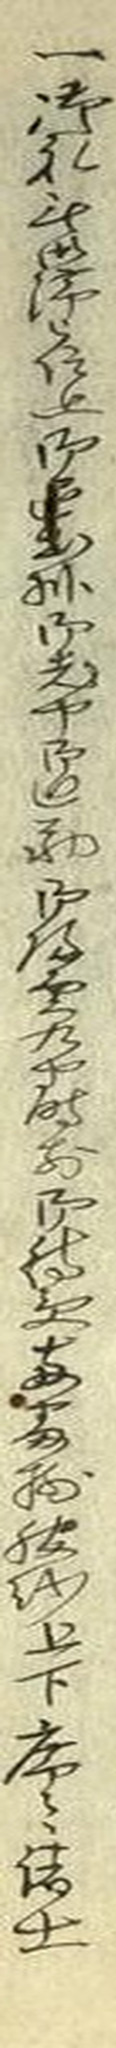一御礼無御滞被仰上御退出掛御老中御廻勤御帰殿九半時前御待受両番揃服沙上下席々へ諸士
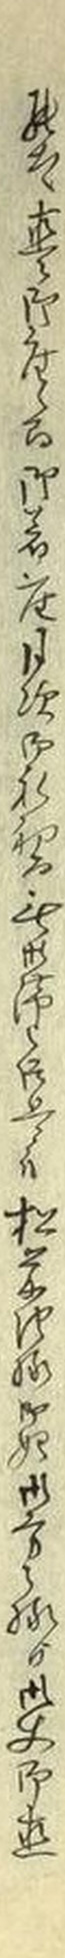罷出候直ニ御座之間御着座月次御礼初而無御滞被仰上候ニ付松栄院様御始御方々様ゟ御使御直
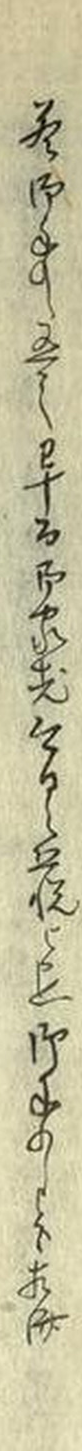答御手のし有之畢而御家老今日之恐悦被申上御手のし被下相済
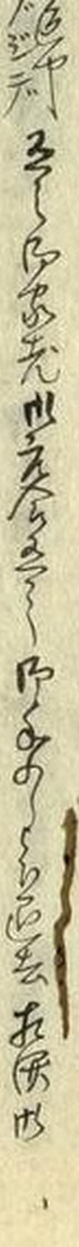ブジデ有之御家老御取合有之御手のし被下退去相済御
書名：少傅日録抄（斉善付側向頭取日記、在府）
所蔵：福井県文書館 Fukui Prefectural Archives
